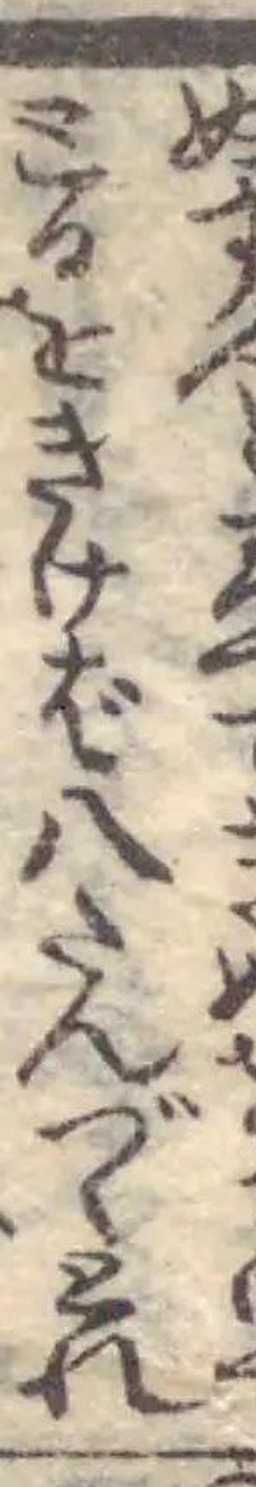とるをきけば八たんつゞとれ
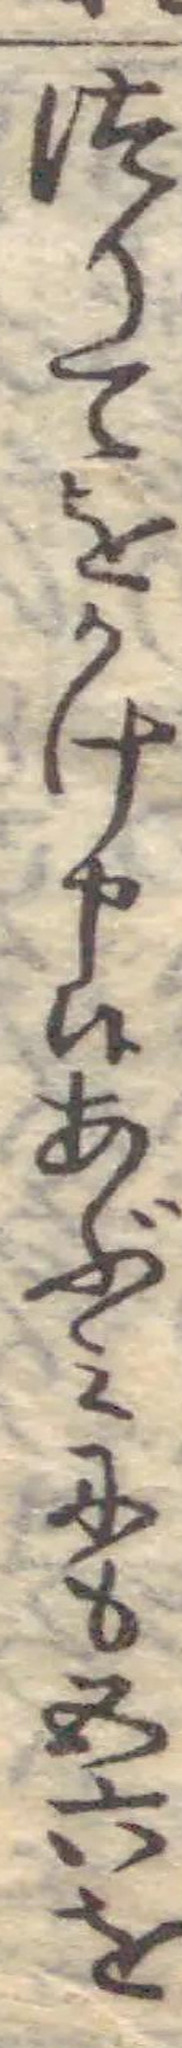つりてをかけ申候あぶみにも五六を
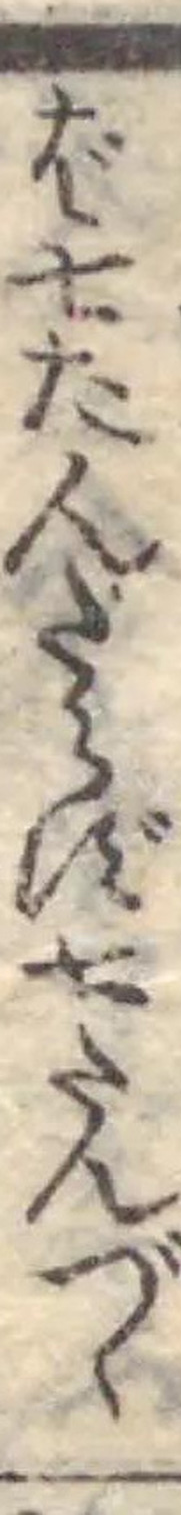ば七たんたらず七たんづゝ
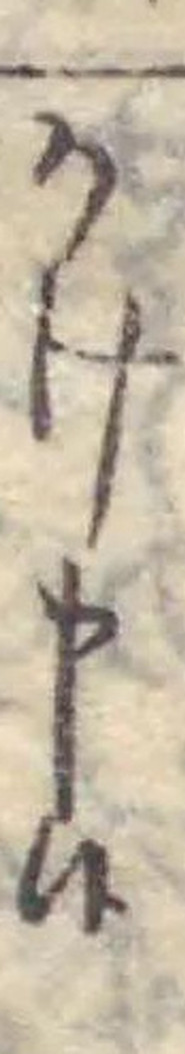かけ申候
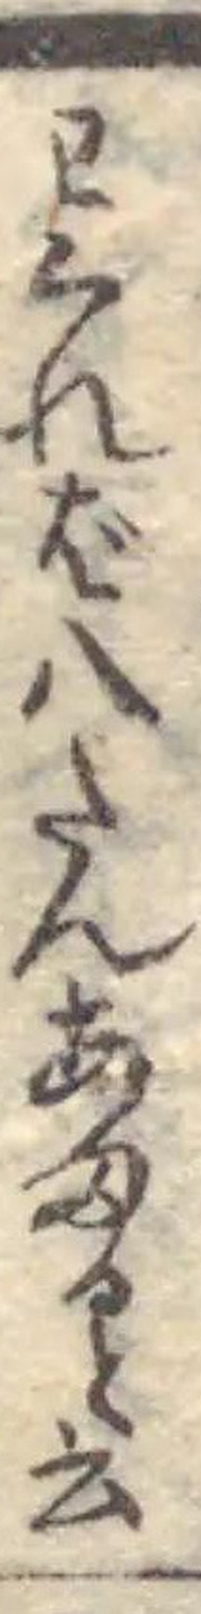わくれば八たんあまると云
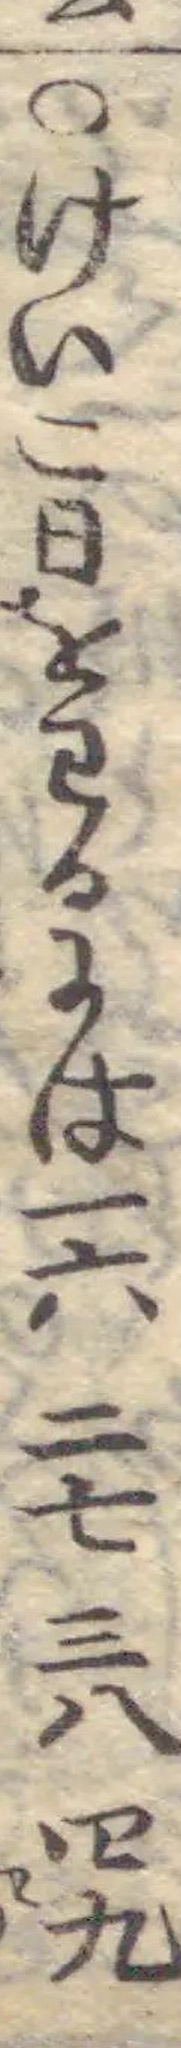○けいこ日をわるには一六二七三八四九
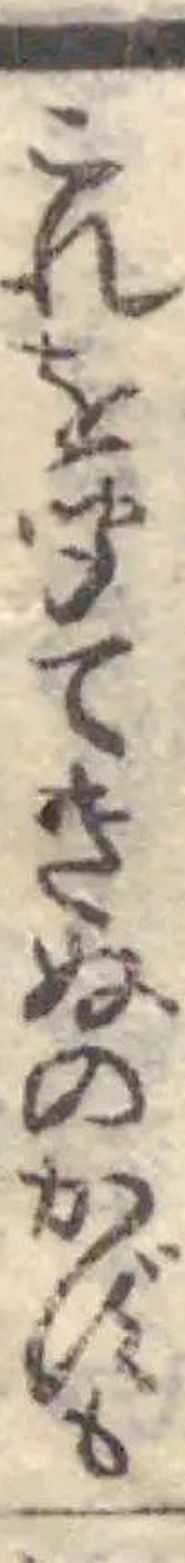これを聞てきぬのかずも
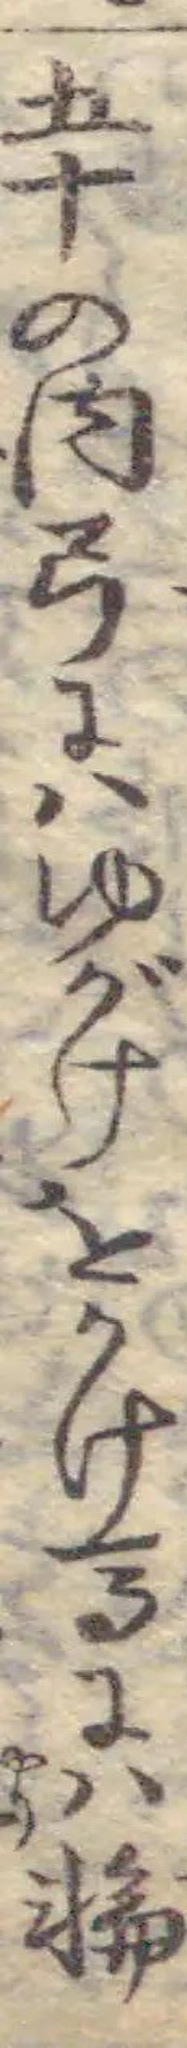五十の内弓にはゆがけをかけ馬には輪
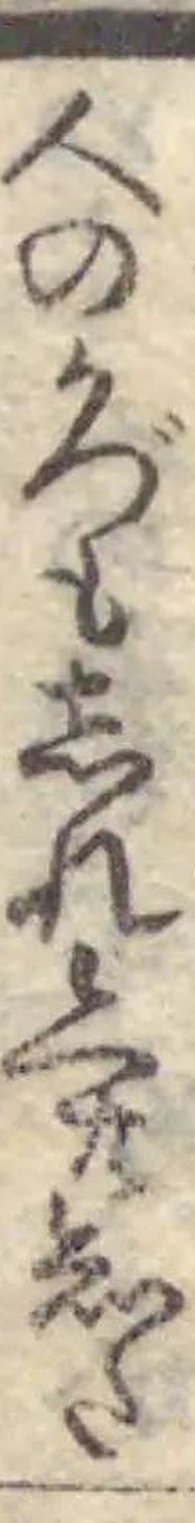人のかずもしれ候へ共知た
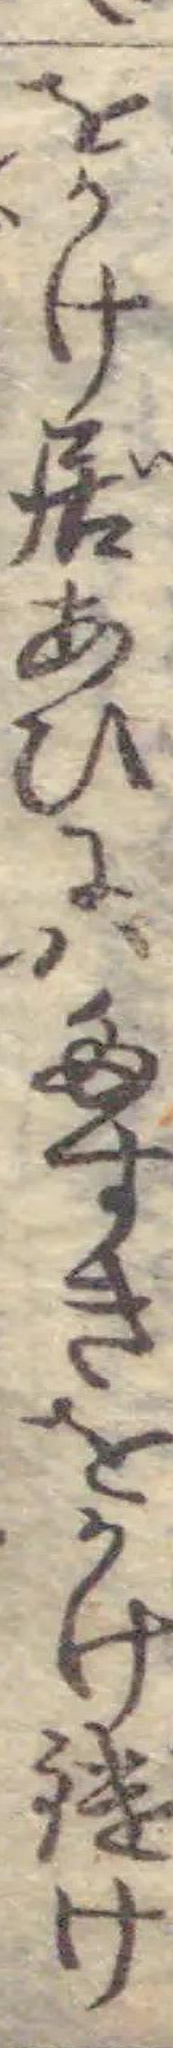をかけ居あひにはたすきをかけ鑓けん
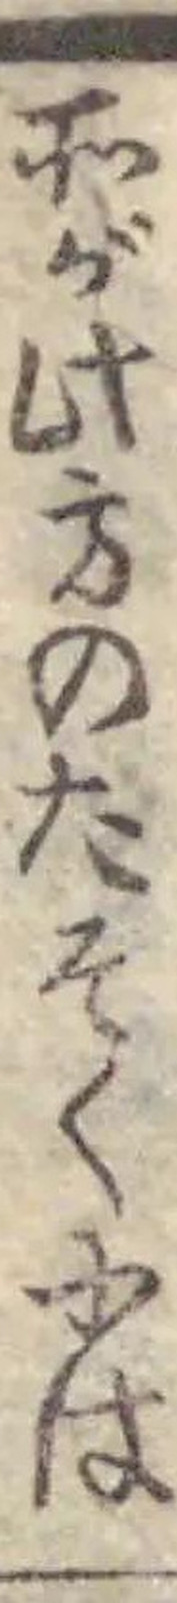所が此方のたそくには
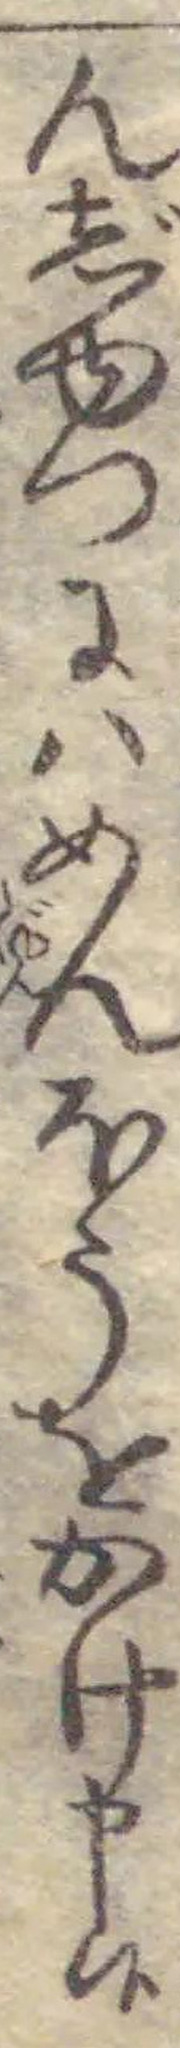じゆつにはめんほうをかけ申候
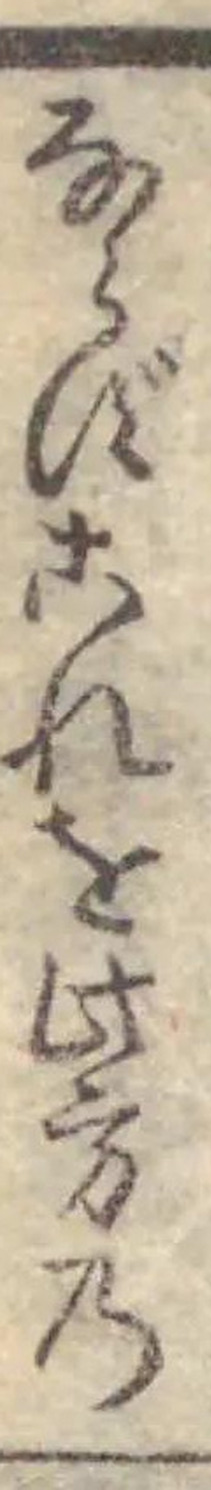ならずこれを此方の
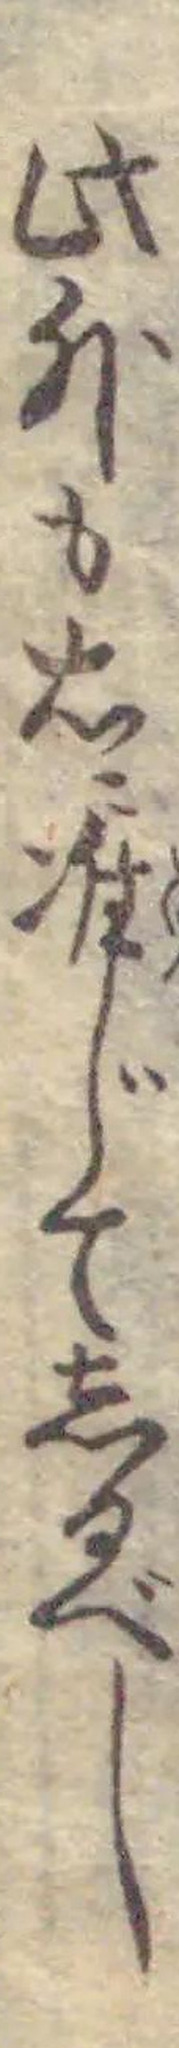此外も忠に准じてしるべし

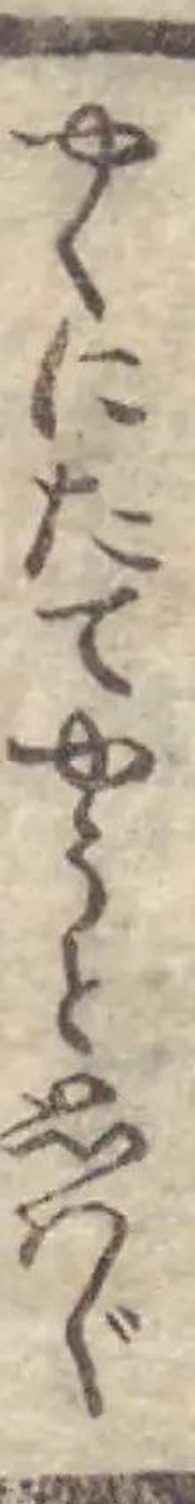やくにたてやうと思はゞ
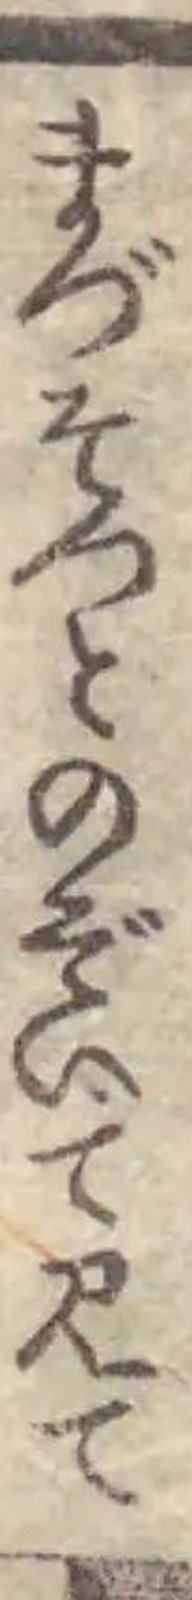まづそつとのぞいて見て
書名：大通人好記
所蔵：国立国会図書館 National Diet Library, JAPAN
